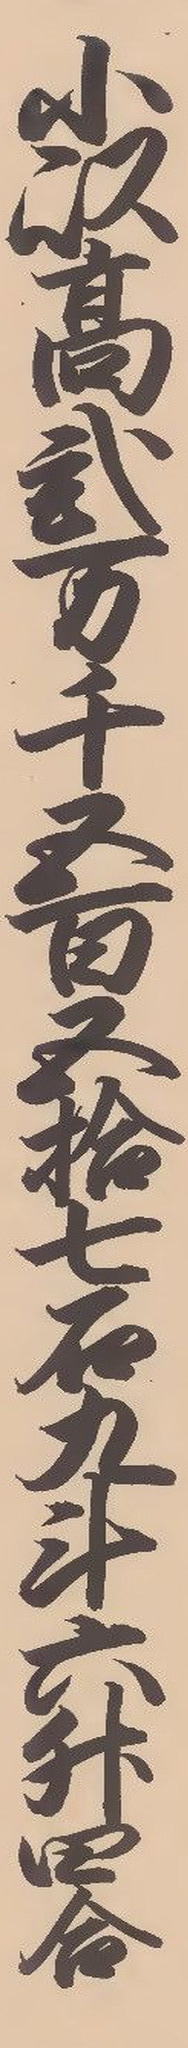小以高弐万千五百五拾七石九斗六升四合

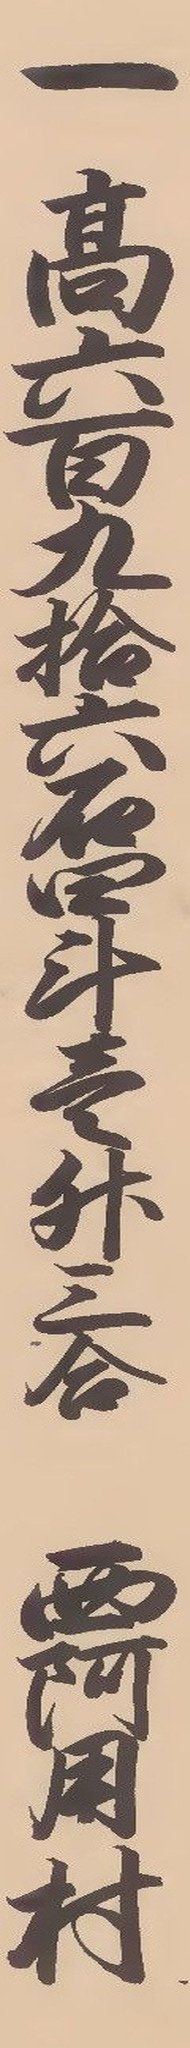一高六百九拾六石四斗壱升三合西阿用村
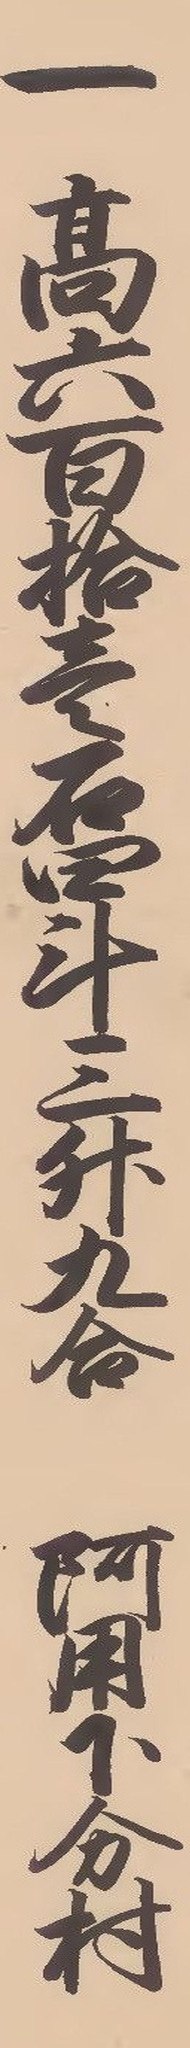一高六百拾壱石四斗三升九合阿用下分村
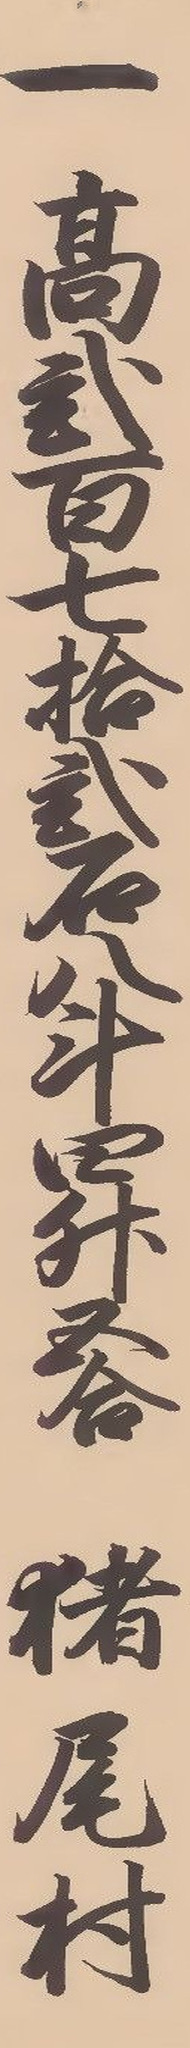一高弐百七拾弐石八斗四升五合猪尾村
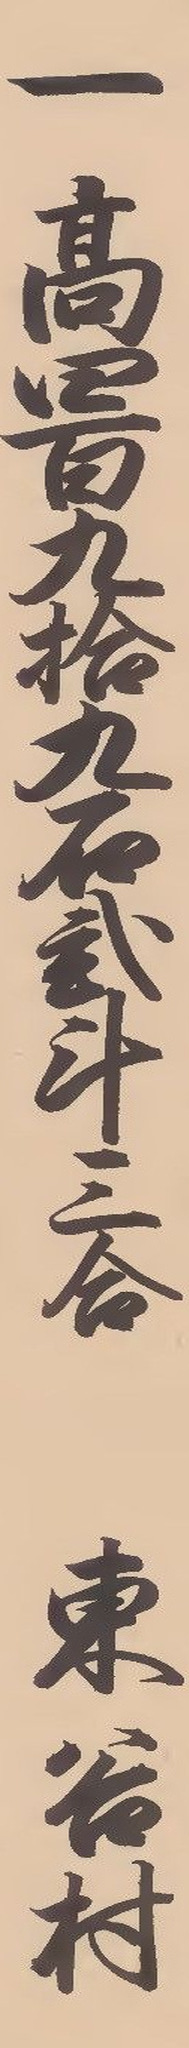一高四百九拾九石弐斗三合東谷村
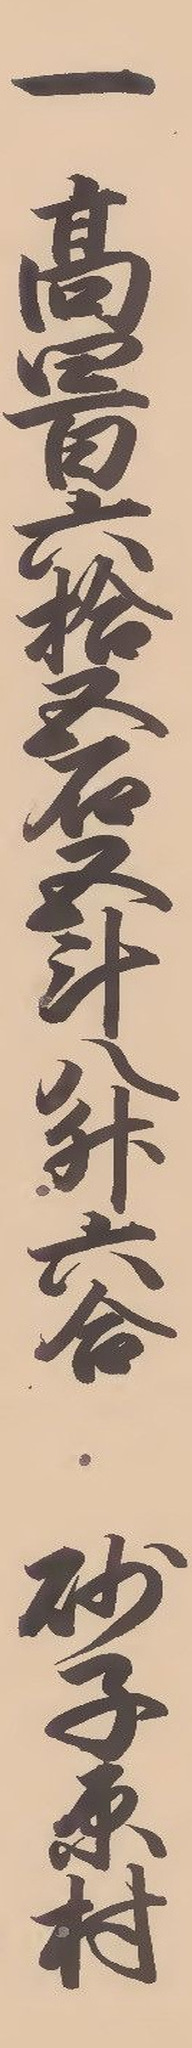一高四百六拾五石五斗八升六合砂子原村

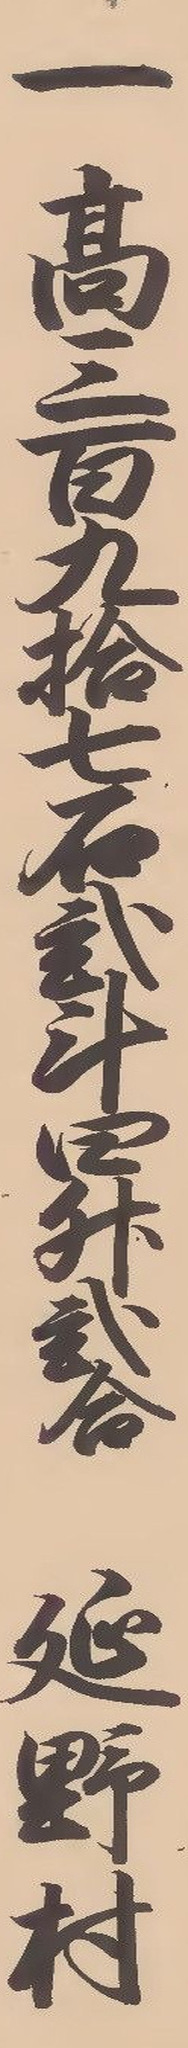一高三百九拾七石弐斗四升弐合延野村
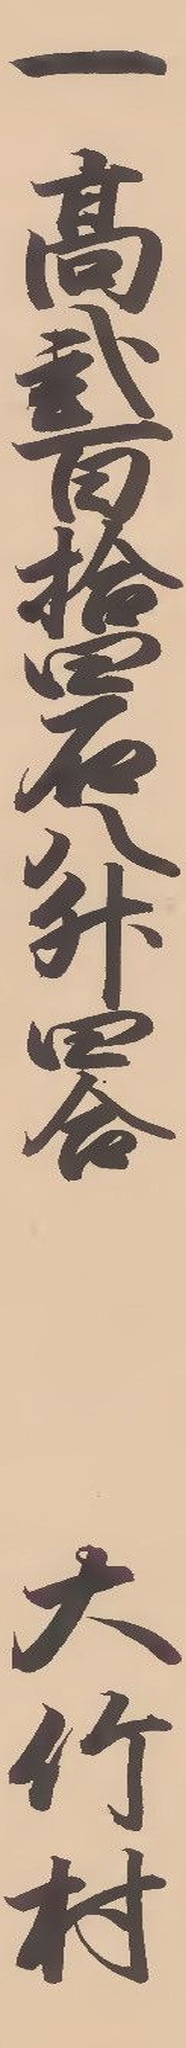一高弐百拾四石八升四合大竹村
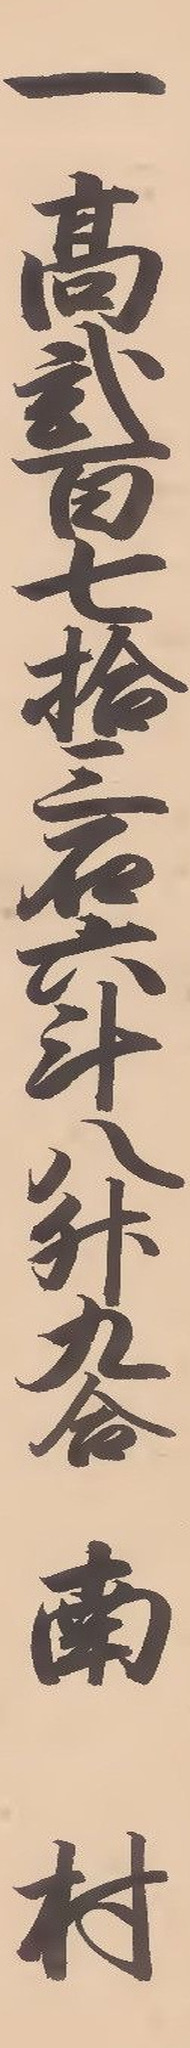一高弐百七拾三石六斗八升九合南村
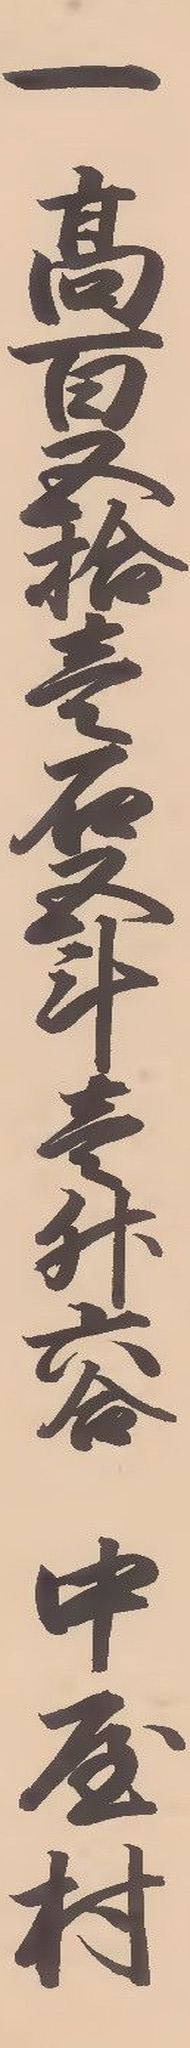一高百五拾壱石五斗壱升六合中屋村
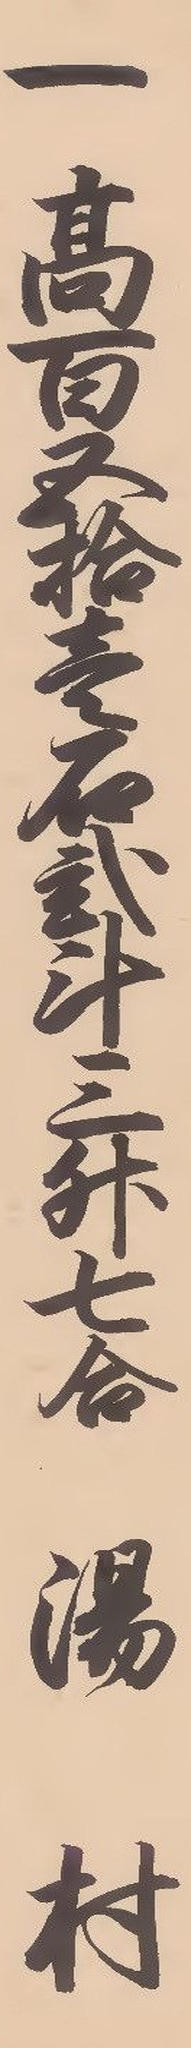一高百五拾壱石弐斗三升七合湯村
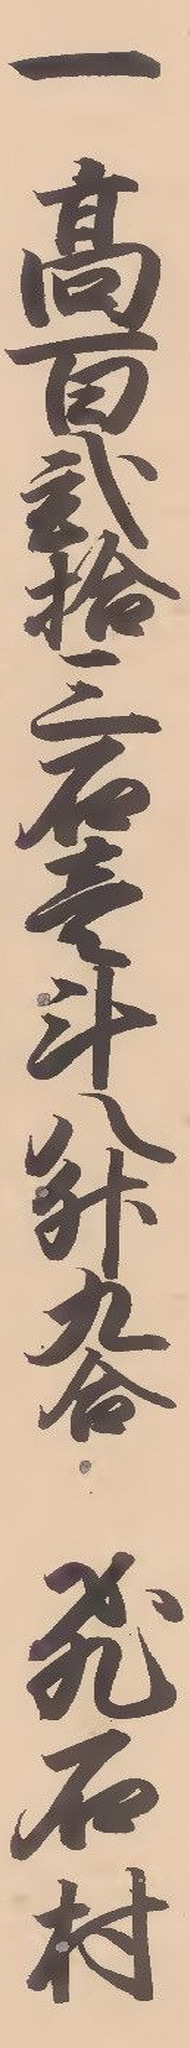一高百弐拾三石壱斗八升九合飛石村

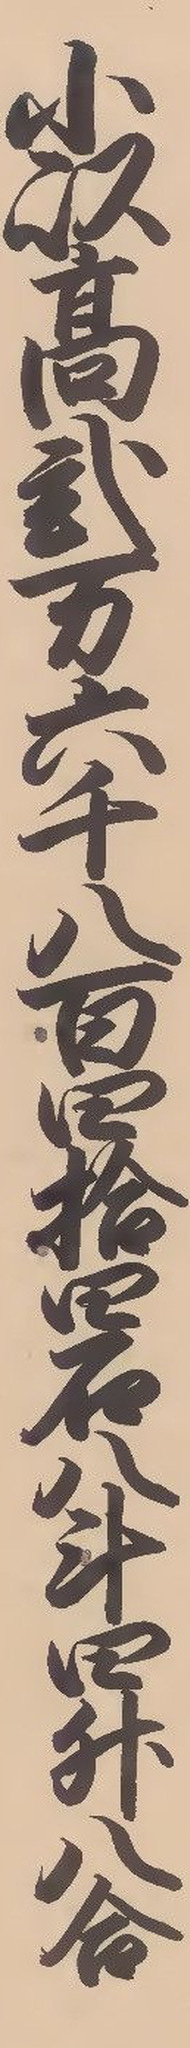小以高弐万六千八百四拾四石八斗四升八合

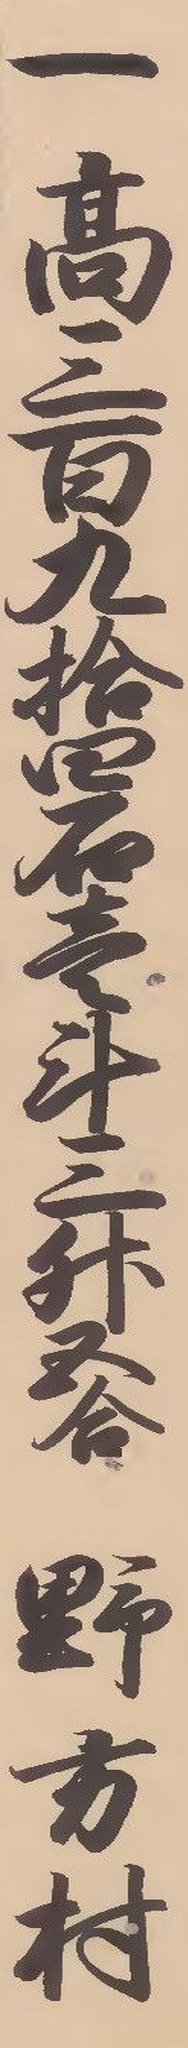一高三百九拾四石壱斗三升五合野方村
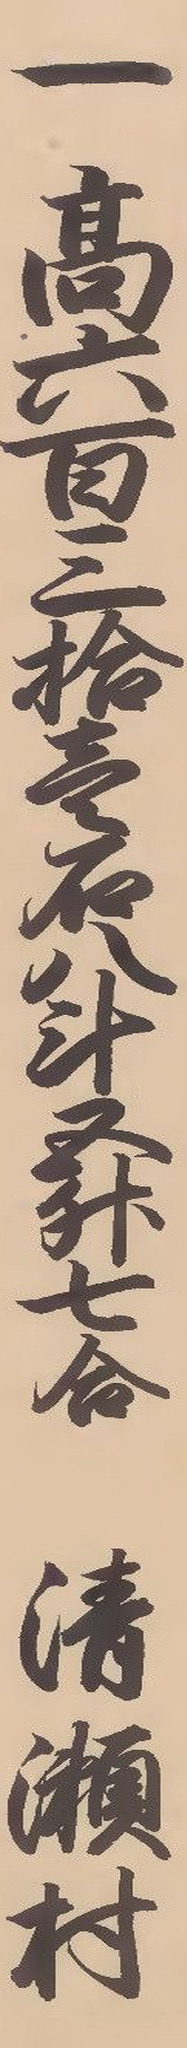一高六百三拾壱石八斗五升七合清瀬村
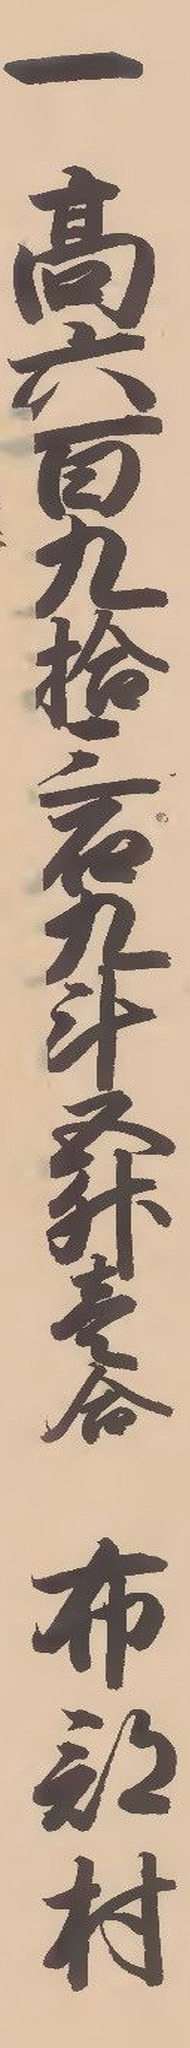一高六百九拾三石九斗五升壱合布部村
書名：出雲国郷帳
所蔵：国立公文書館 National Archives of Japan
